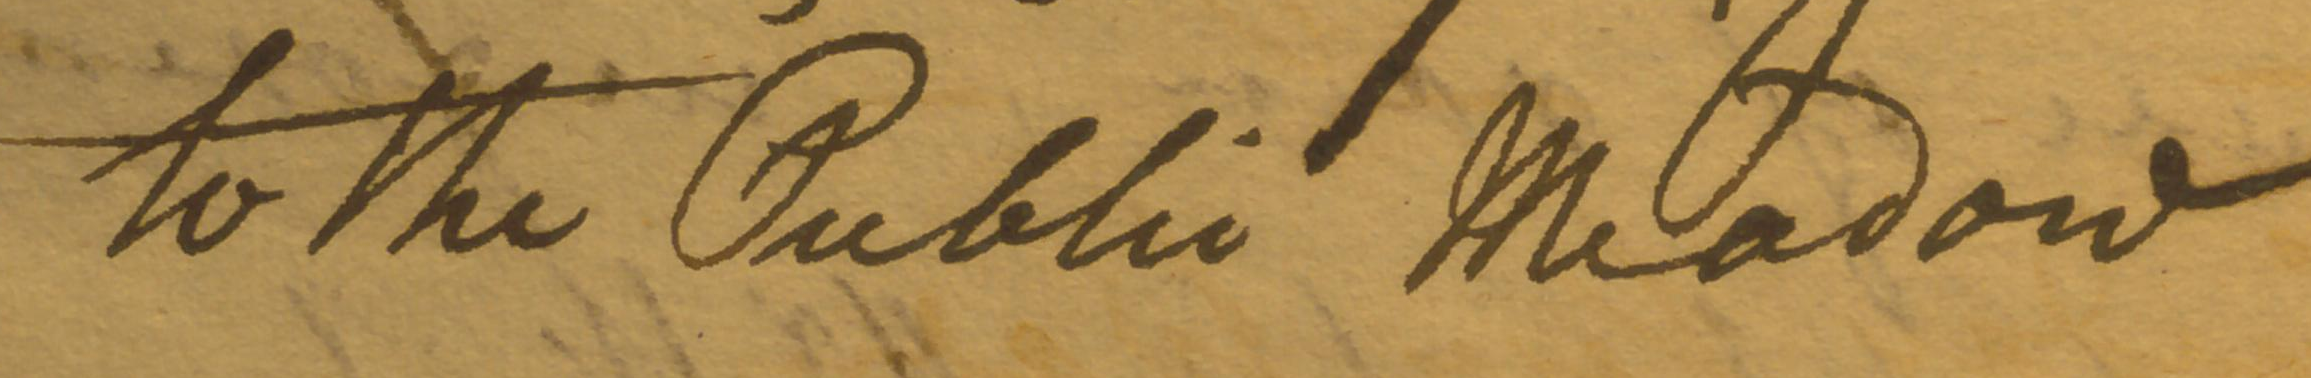to the Public Meadow
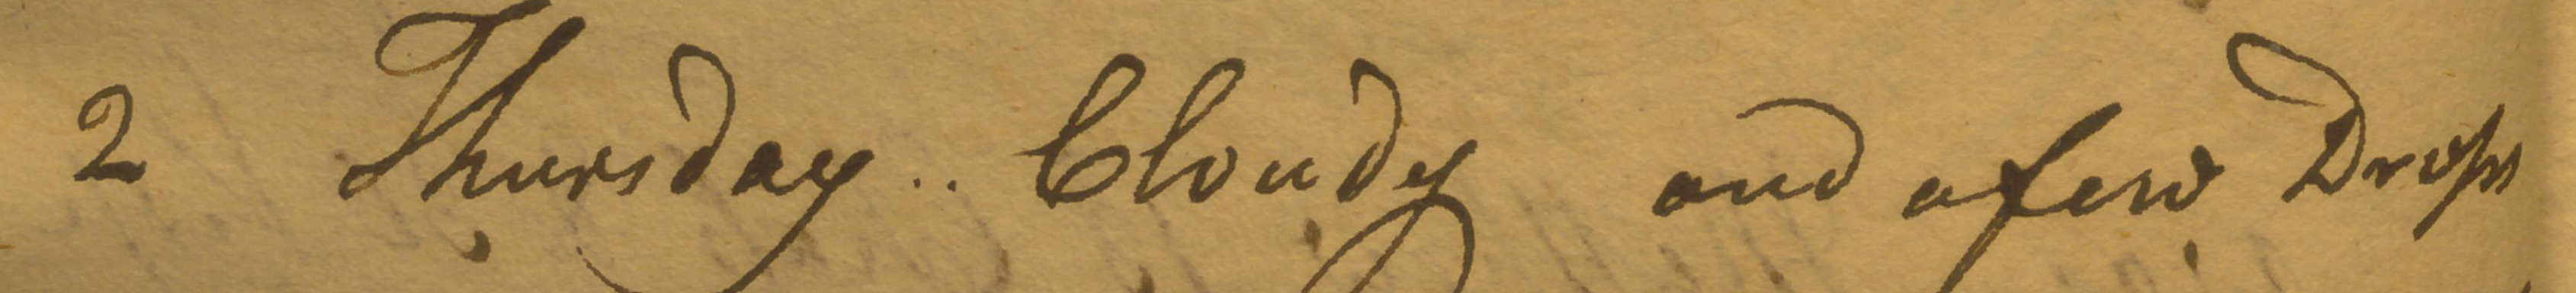2 Thursday. Cloudy and a few Drop
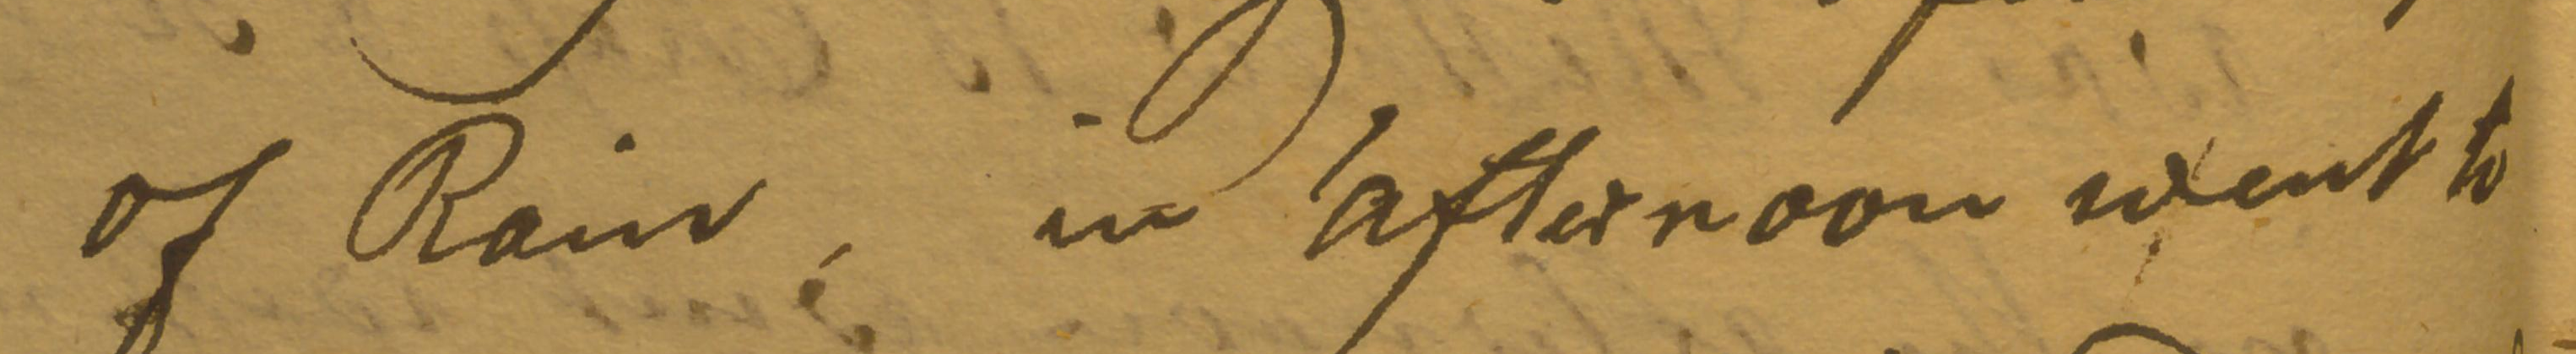of Rain, in afternoon went to
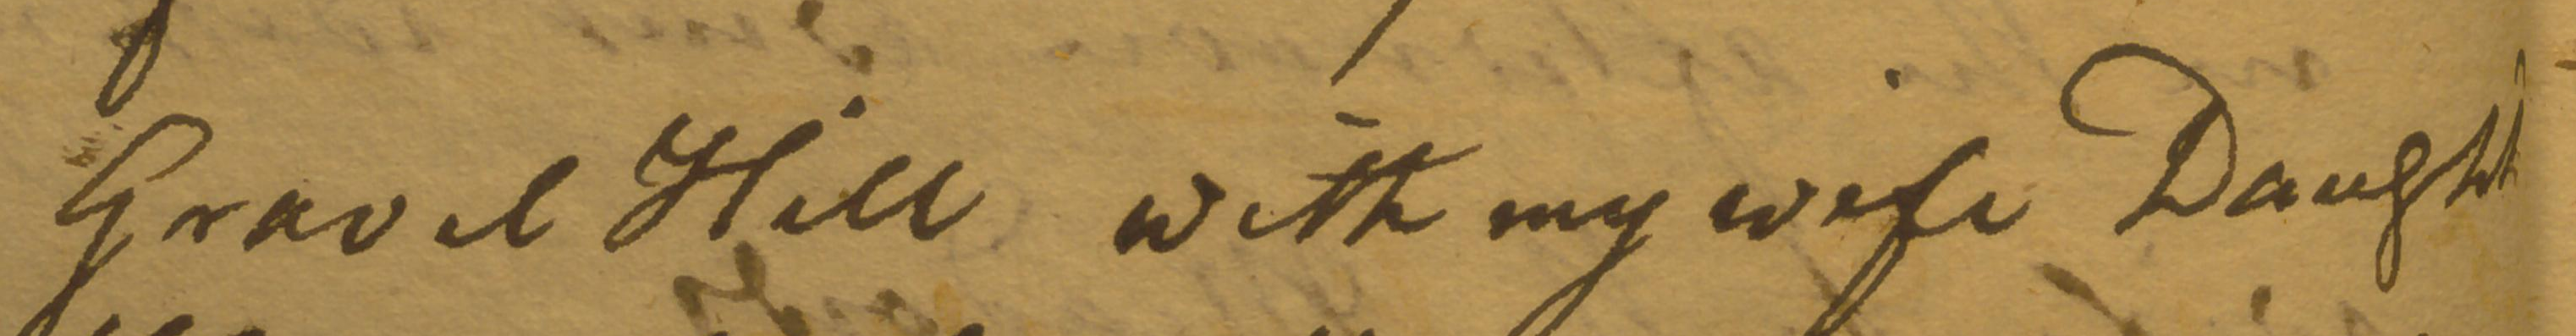Gravel Hell, with my wife Daught
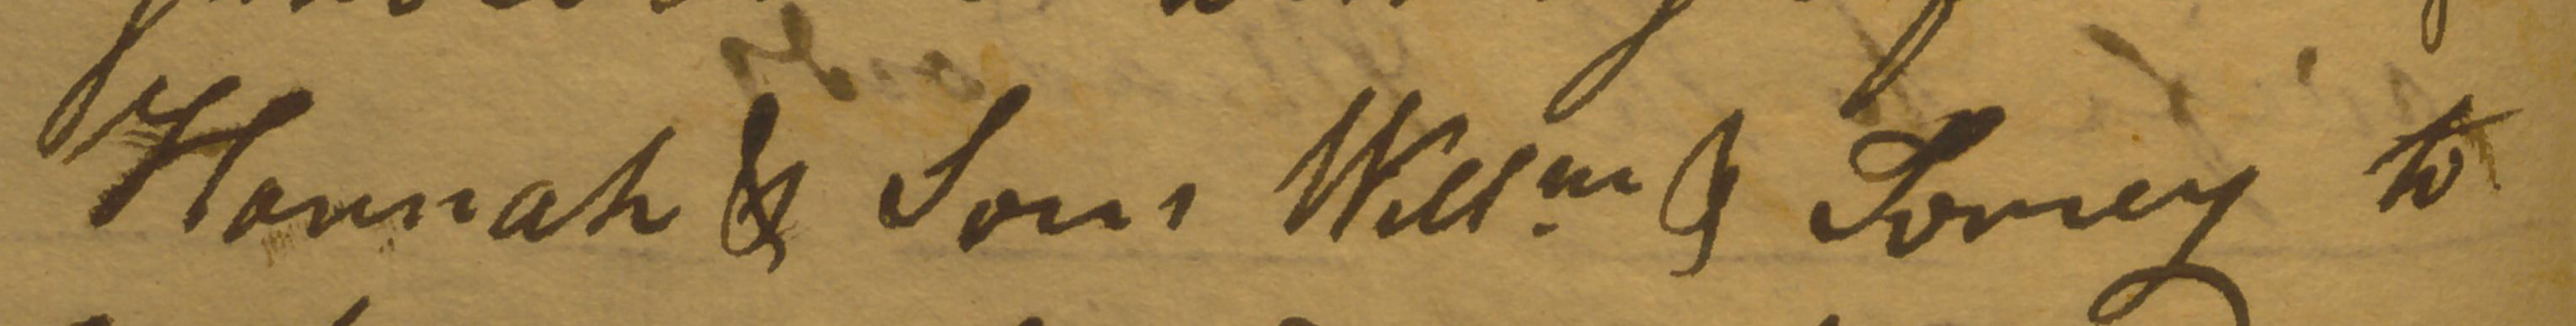Hannah & Sons Will^m. & Tomey to
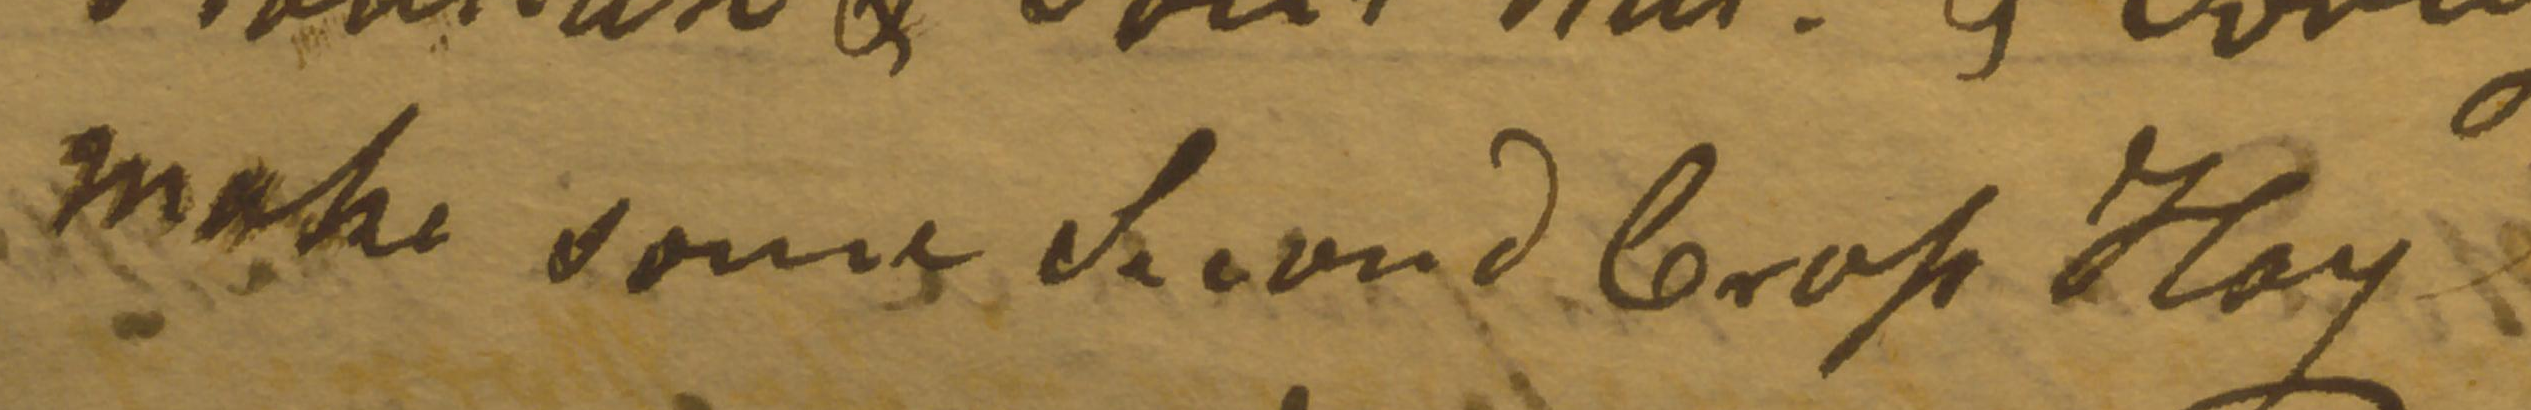make some second Crop Hay
